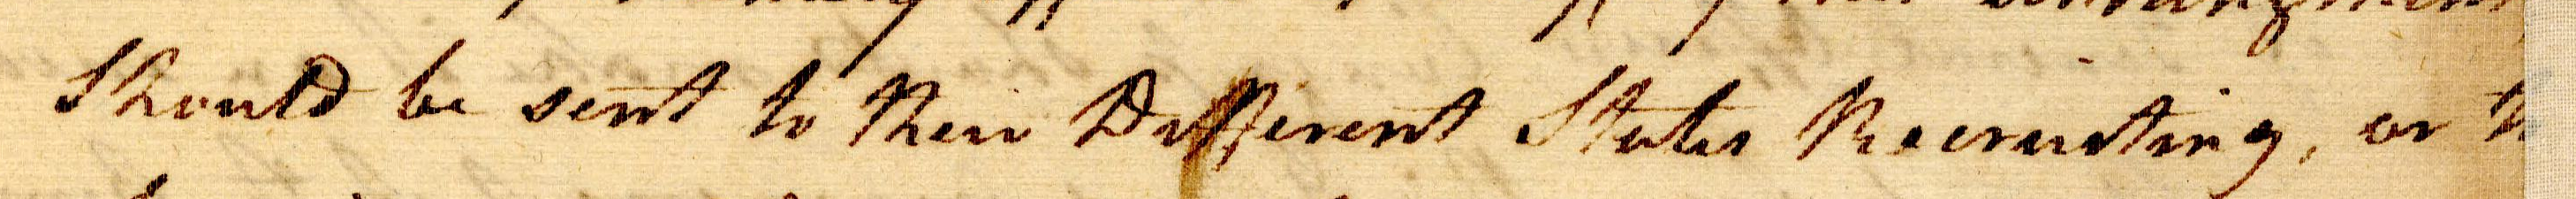should be sent to their Different States Recruiting, or to
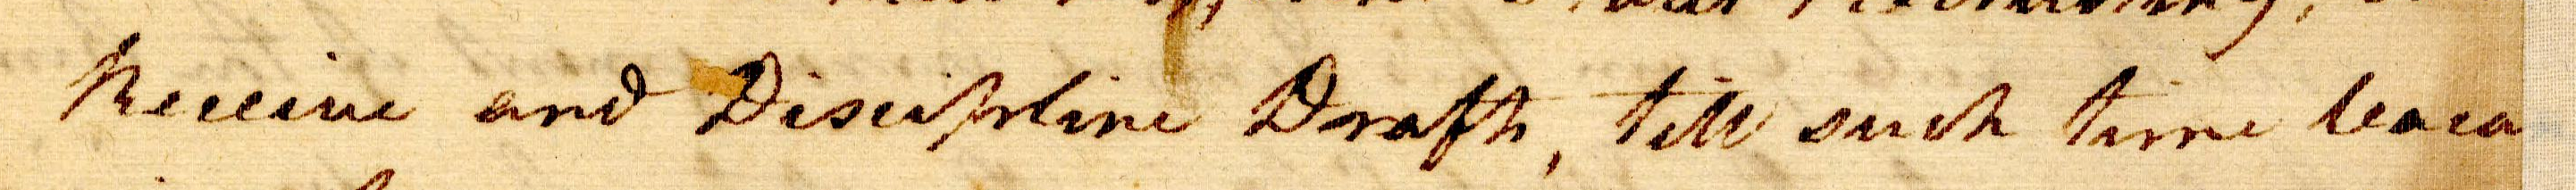Receive and Discipline Drafts, till such time vacan
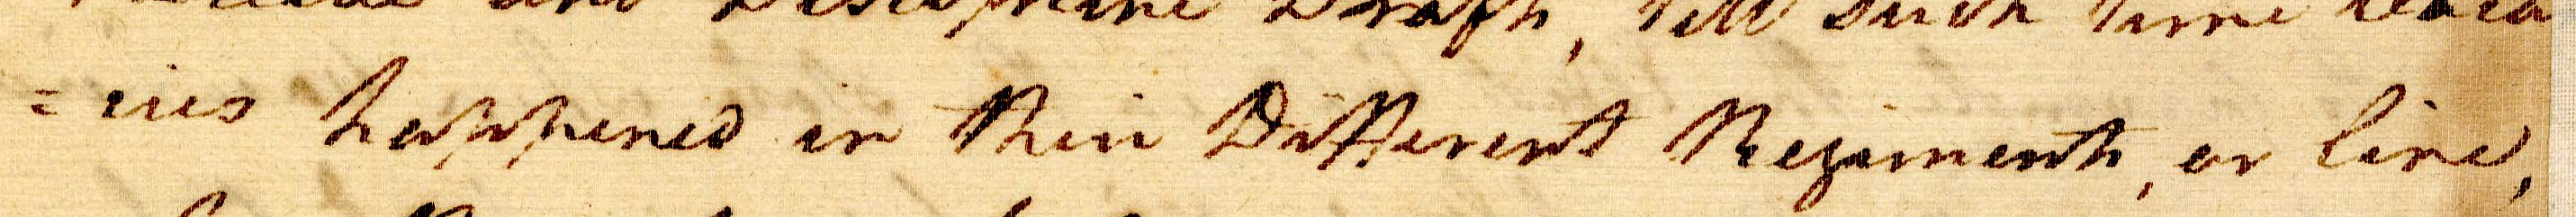-cies happened in their Different Regiments, or line,
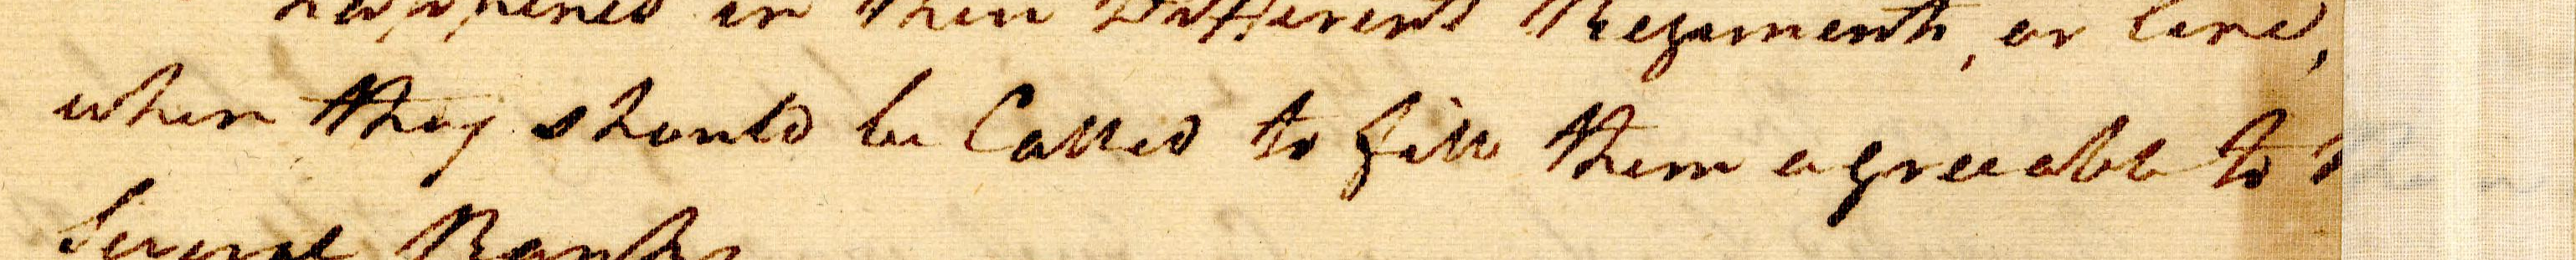when they should be Called to fill them agreeable to their
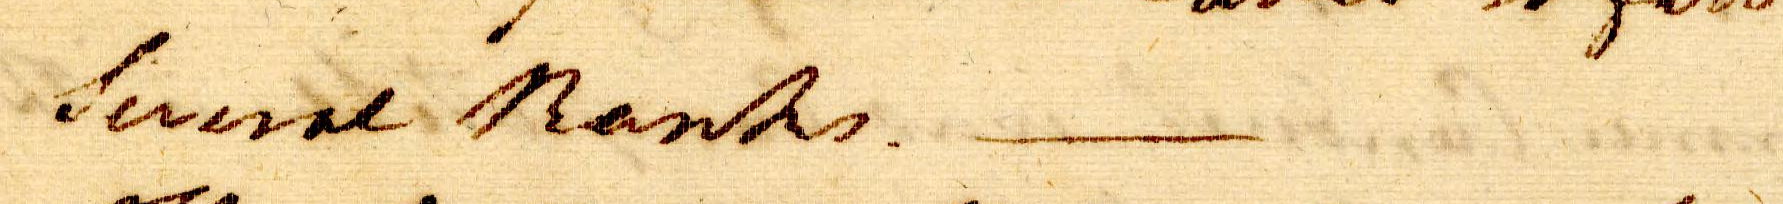several Ranks.-
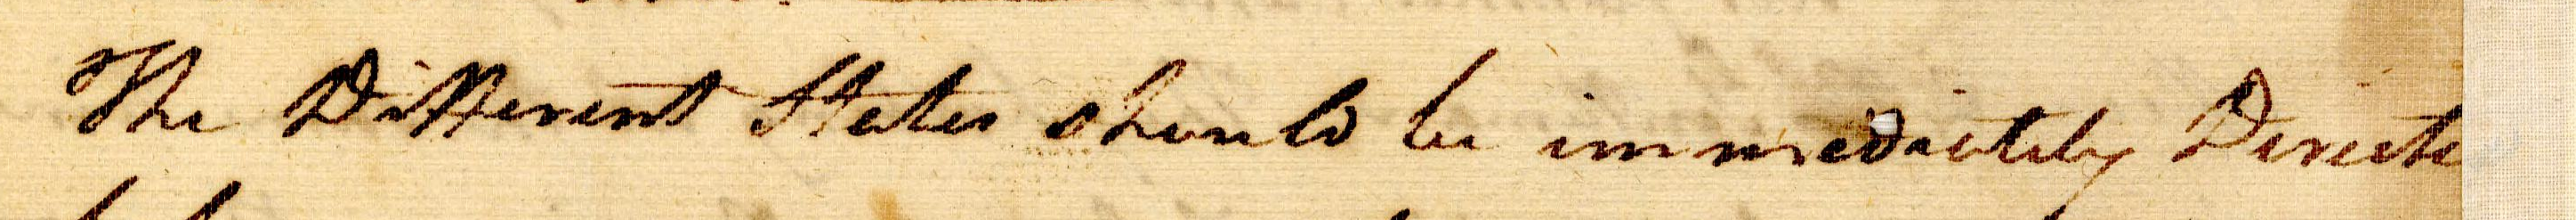The Different States should be immediately Directed
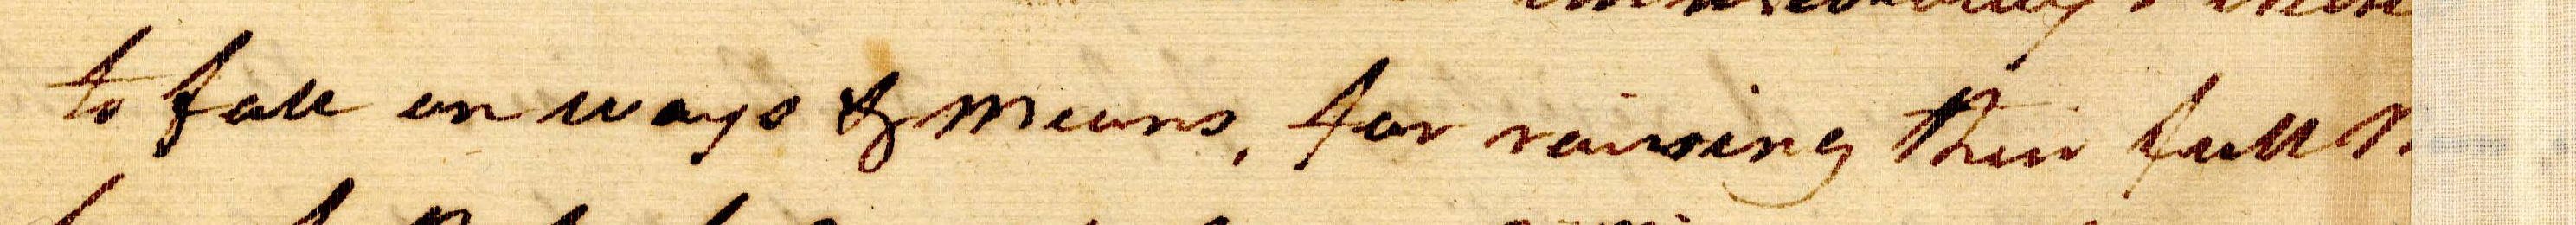to fall on ways & means, for raising their full num
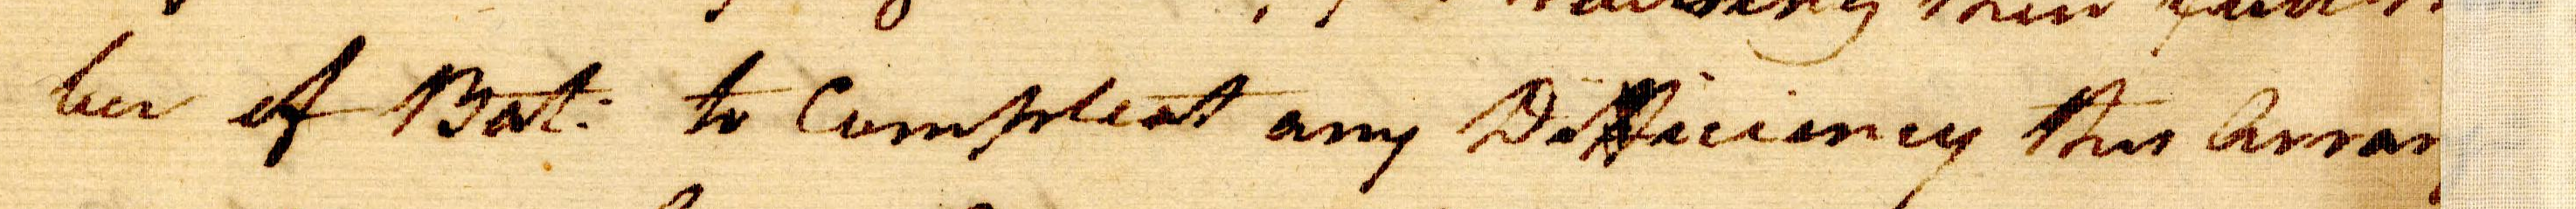ber of Bat: to Compleat any Defficiency this Arrang-
